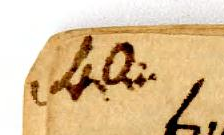40
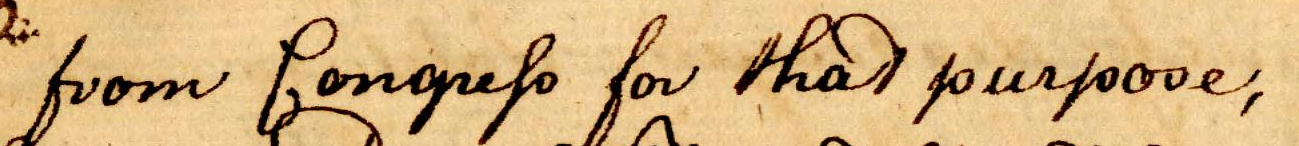from Congress for that purpose,
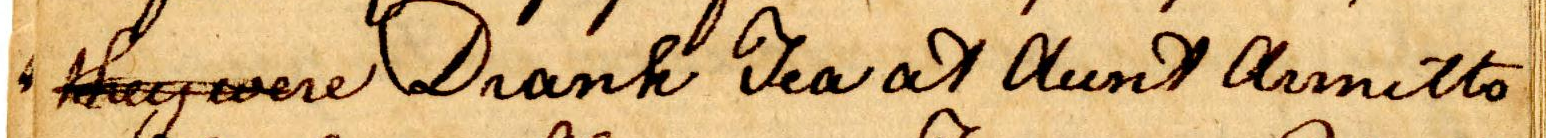they were Drank Tea at Aunt Armitts
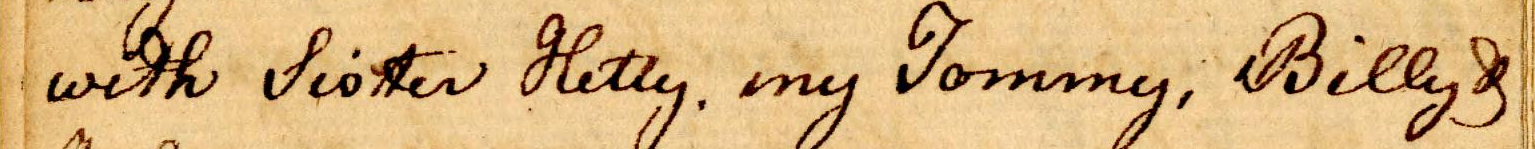with Sister Hetty, my Tommy, Billy &
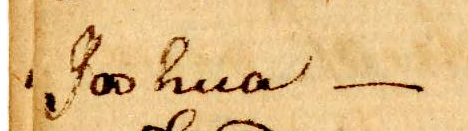Joshua-
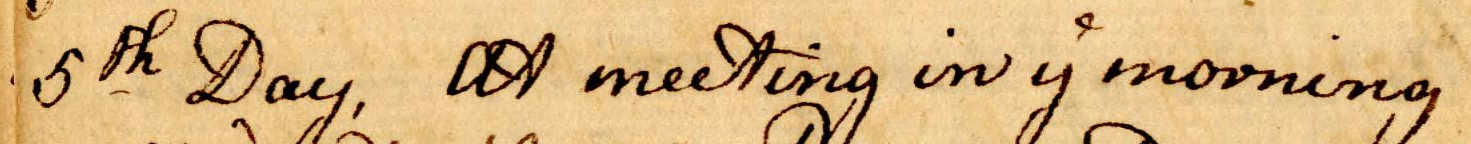5^th Day, At meeting in y^e morning
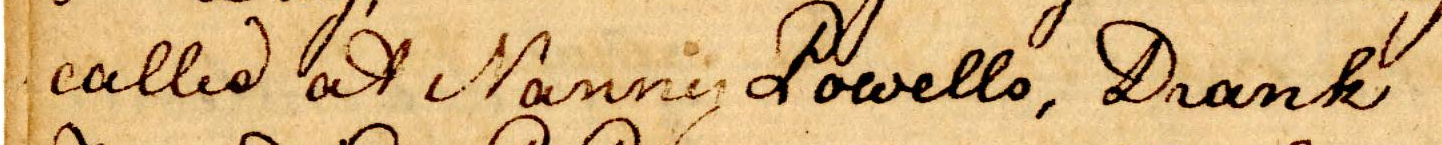called at Nanny Powells, Drank
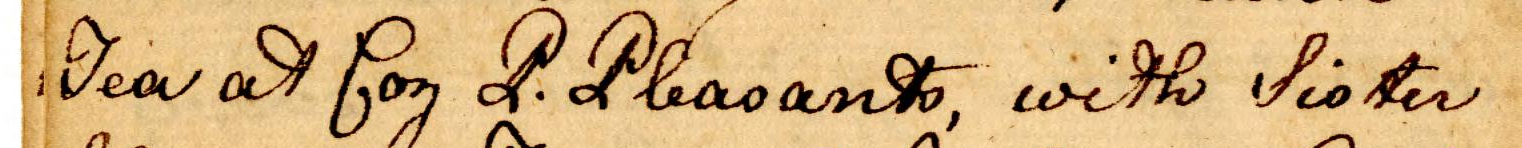Tea at Coz P. Pleasants, with Sister
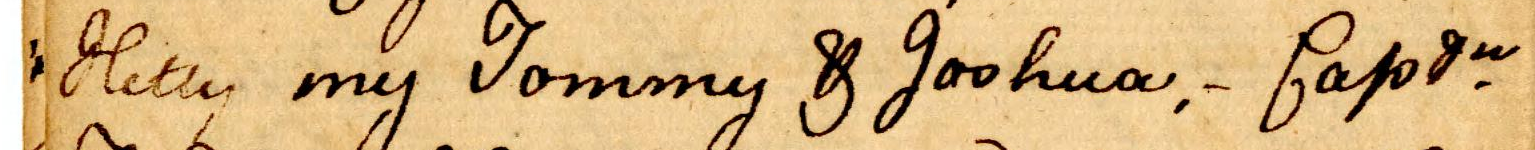Hetty my Tommy & Joshua- Capt^n
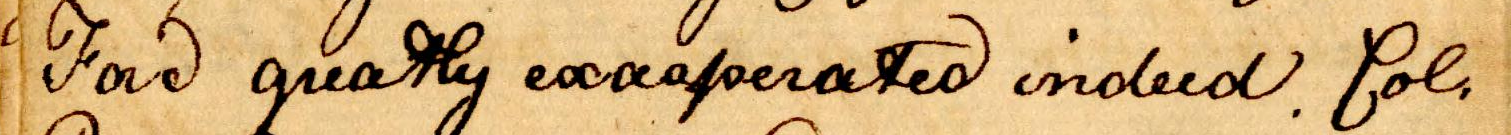Ford greatly exasperated indeed, Col.
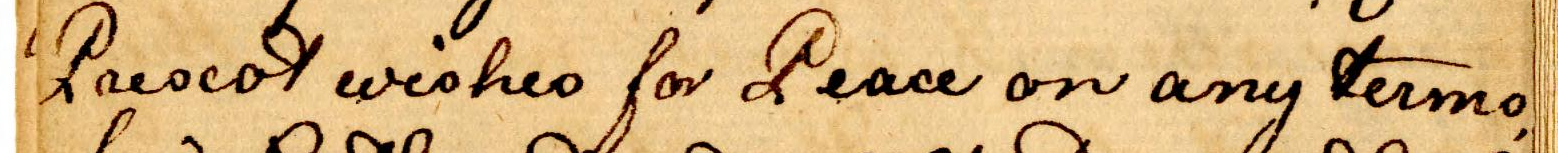Prescot wishes for Peace on any terms
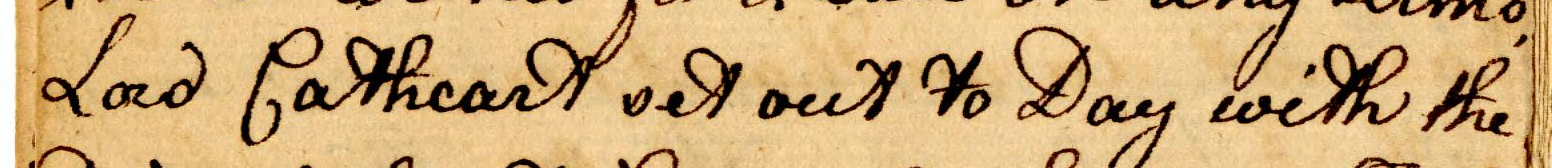Lord Cathcart set out to Day with the
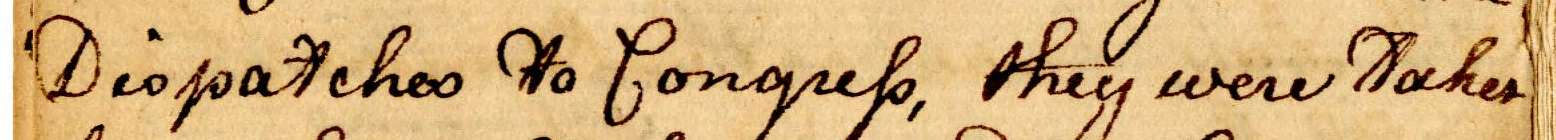Dispatches to Congress, they were taken
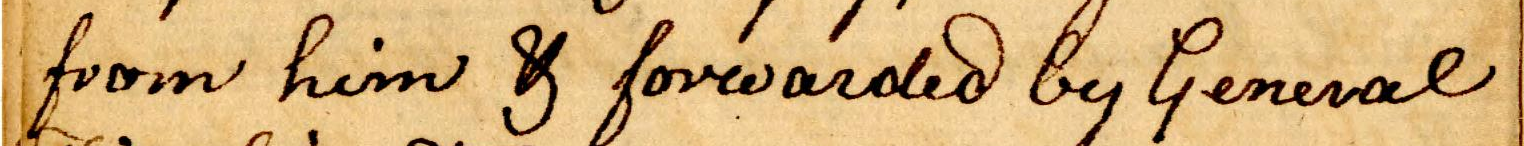from him & forwarded by General
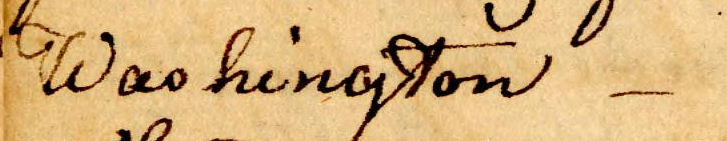Washington-
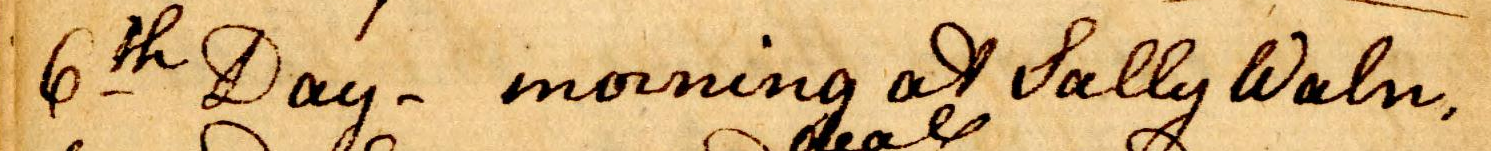6^th Day- morning at Sally Waln,
